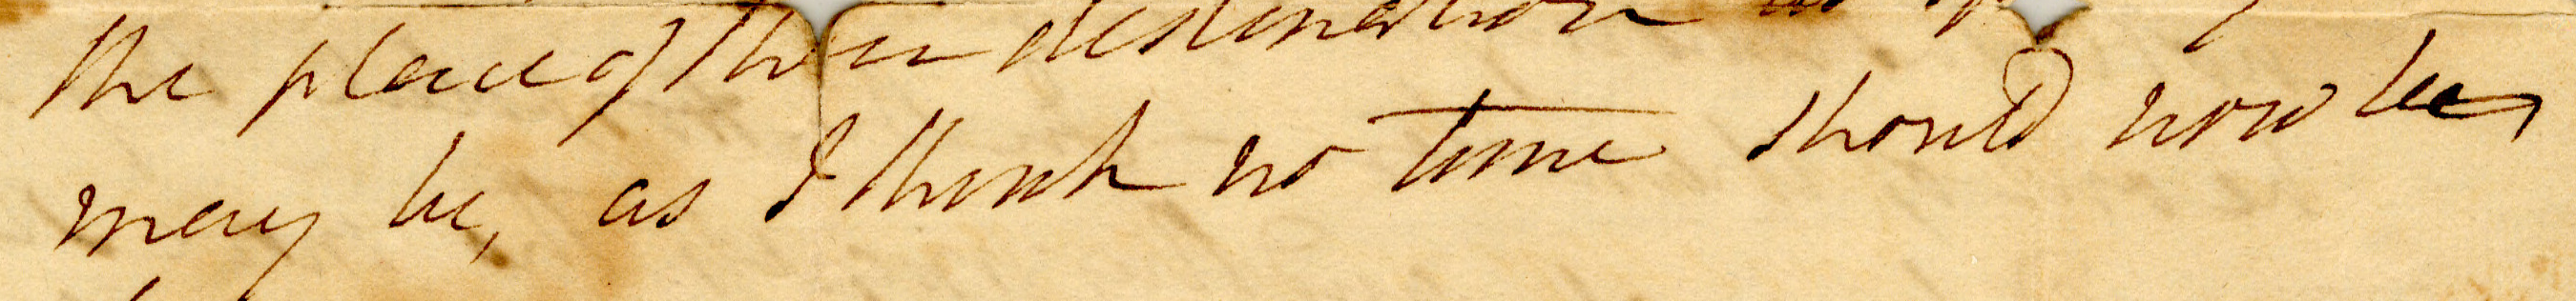may be, as I think no time should now be
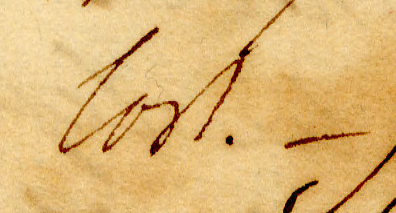lost.-
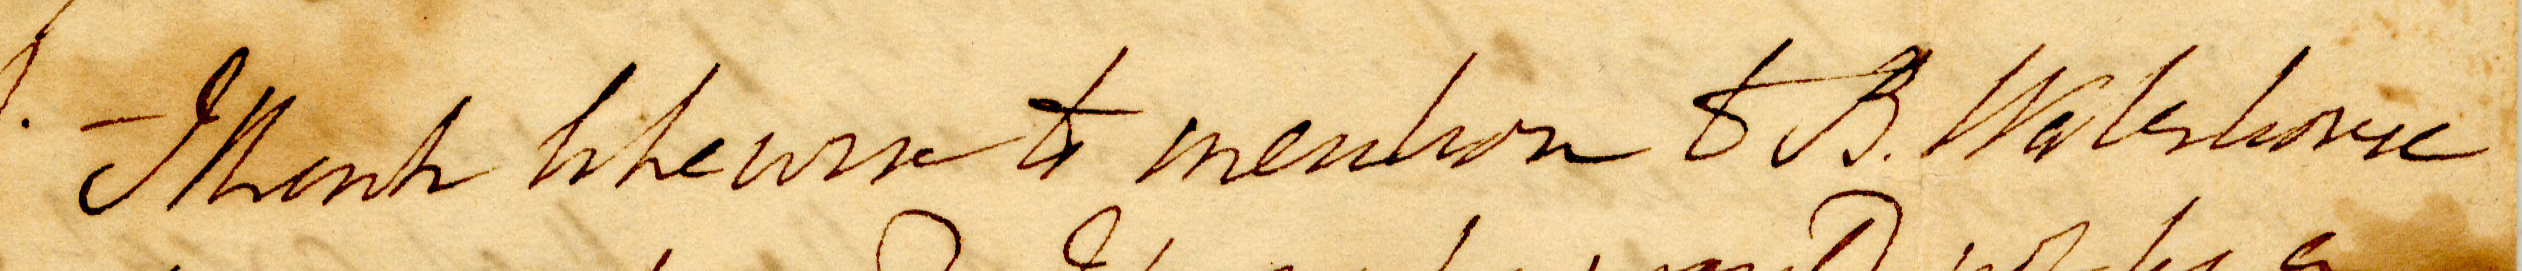I think likewise to mention to B. Waterhouse
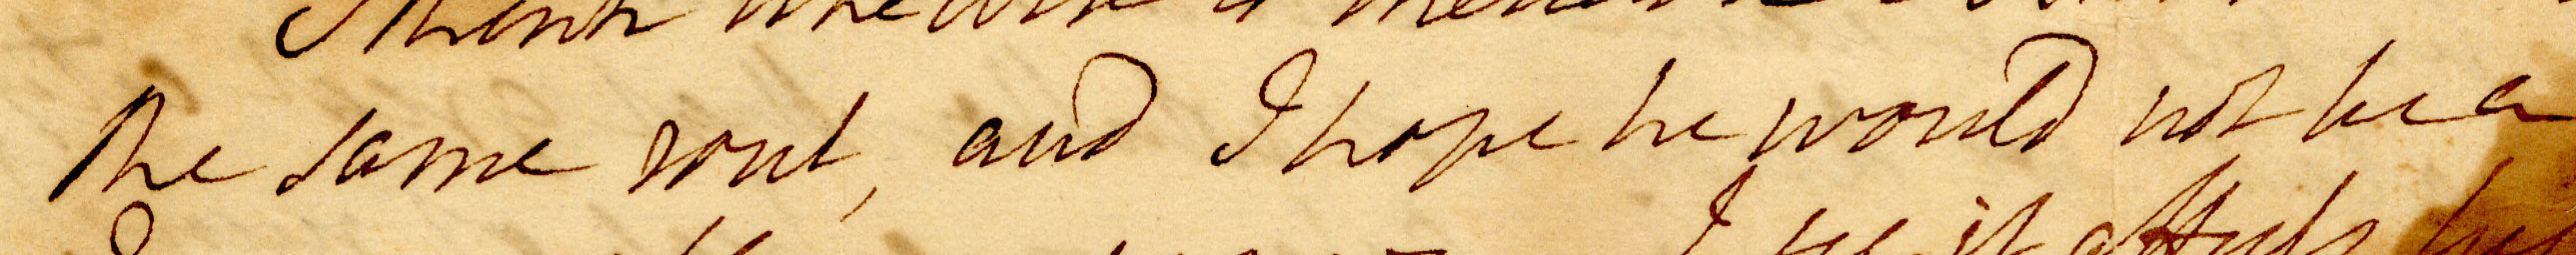the same rout, and I hope he would not be a
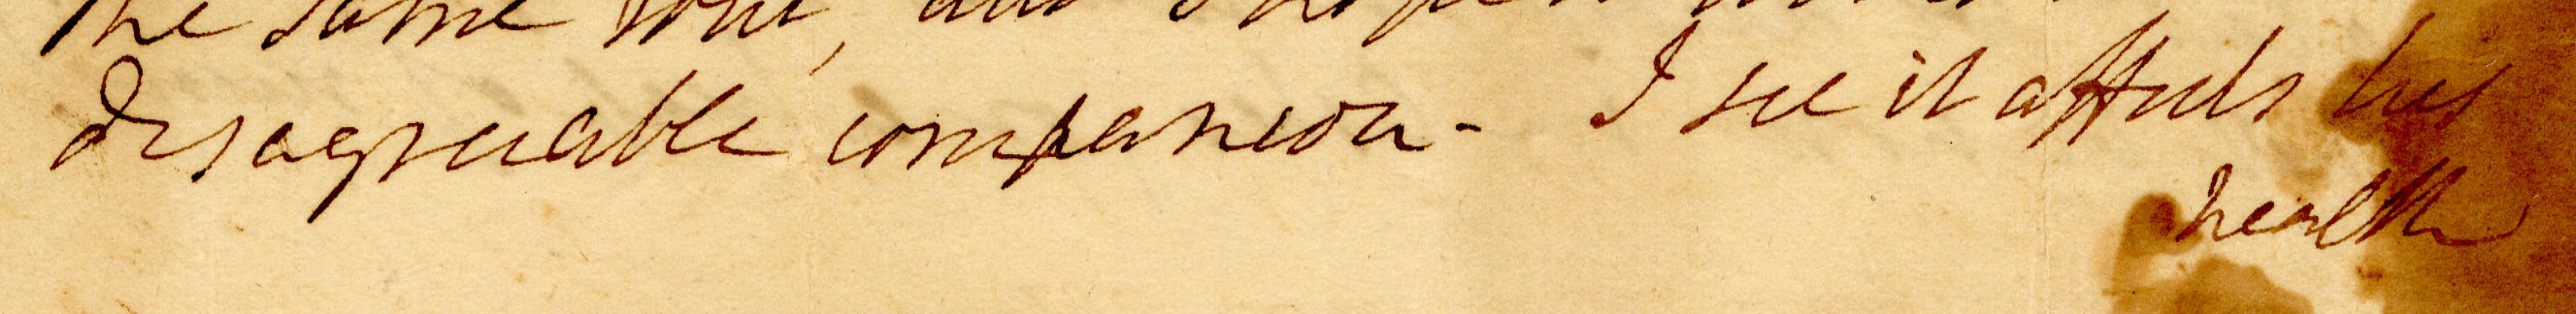disagreeable companion. I see it affects his
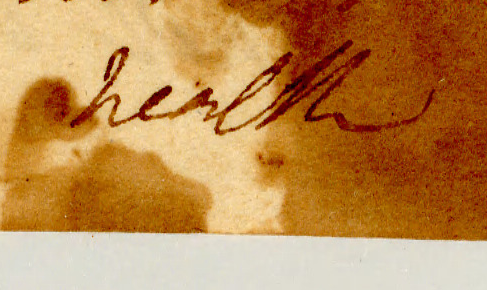health
